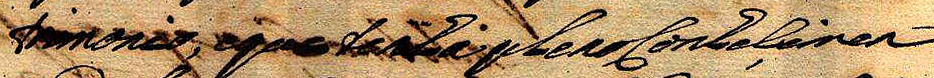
trimonio, e que tenha pLeno ConheÇimen
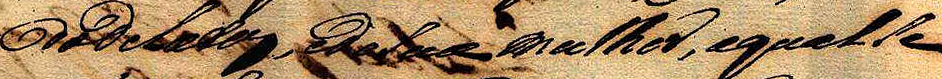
do DeLato, e da sua mulher, a quaL se
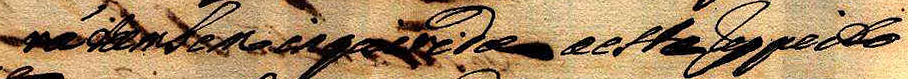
rá tambem inquirida a este Respeito
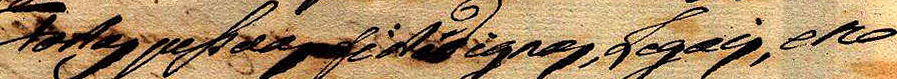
todas pessoas fidedignas, Legais, e no
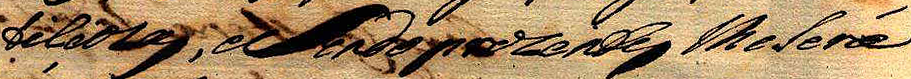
tiÇiozas, e sendo prezentes lhe será
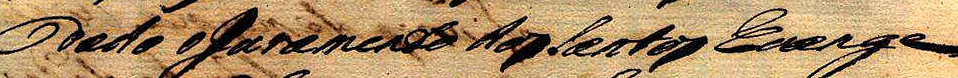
dado o Juramento dos Santos Evange
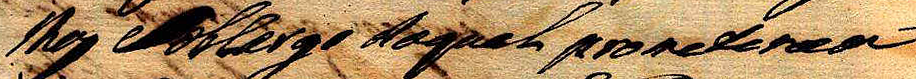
lhos SobCargo do quaL prometeram
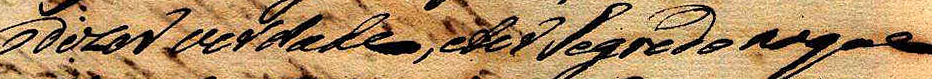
dizer verdade, e ter Segredo no que
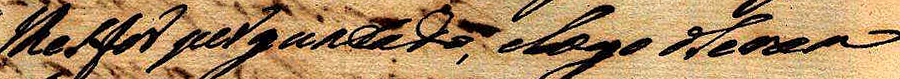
lhes for perguntado, e Logo o seram
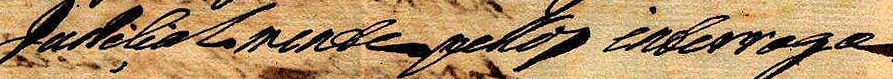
JudiÇiaLmente pellos interroga
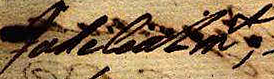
JudiÇiaLm,te
